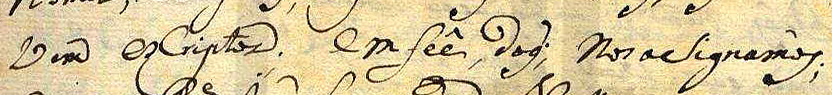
Vem esCriptoz; em feê, do q̄; nos aSignamos;
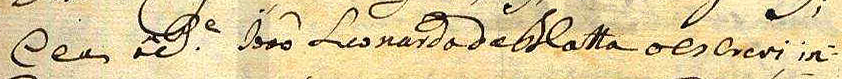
E eu o P.e Ioaõ Leonardo da Matta o escrevi, in
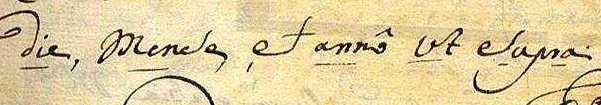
die, Mense, & anno vt Supra:
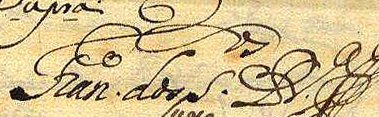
Fran.co dos S.tos Pr.a
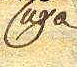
Cura
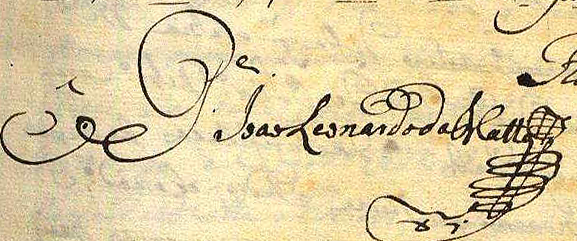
O P.e Ioao Leonardo da Matta
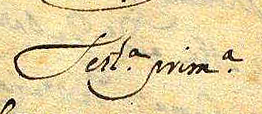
Test.a prim.a
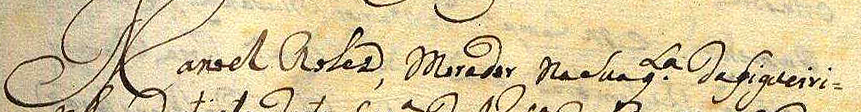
Manoel Rolez, Morador na sua q.ta de figueiri
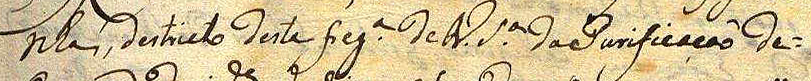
nha, destricto desta freg.a de N. S.a da Purificaçaõ de
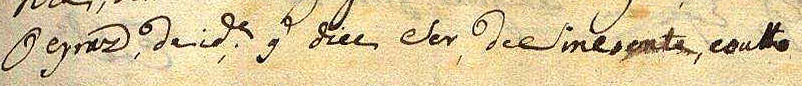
Oeyraz, de id.e q̄ dice ser, de sincoenta, e outto
